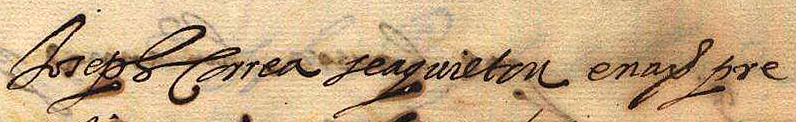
Joseph Correa se aquietou, e naõ pre
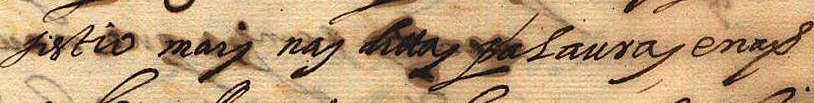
sistio mais nas dittas palauras, e naõ
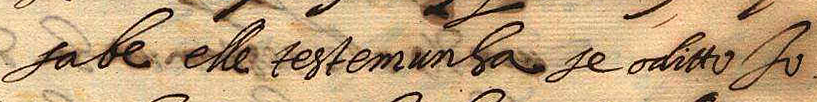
sabe elle testemunha se o ditto Jo
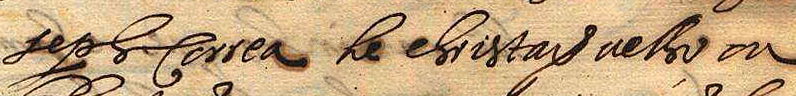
seph Correa he christaõ uelho, ou
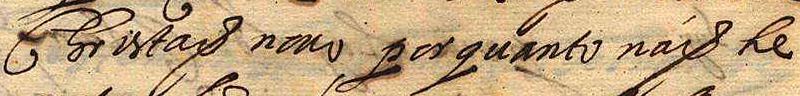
Christaõ nouo, porquanto naõ he
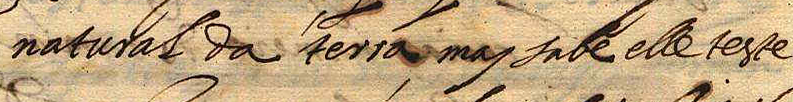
natural da terra, mas sabe elle teste
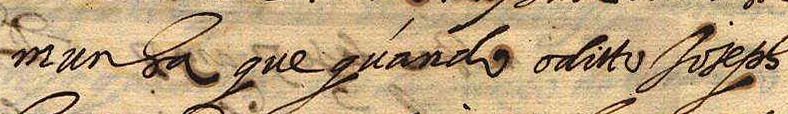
munha que quando o ditto Joseph
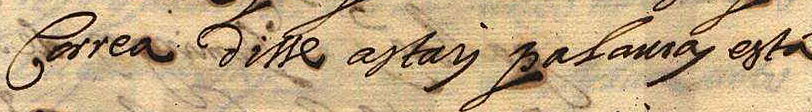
Correa disse as tais palauras está
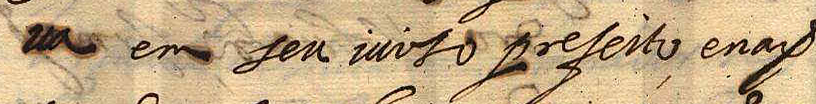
ua em seu iuizo prefeito, e naõ
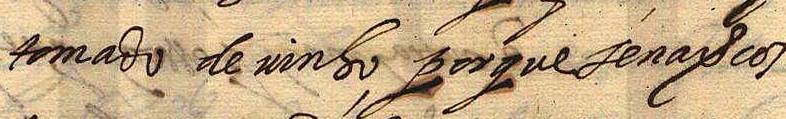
tomado de uinho, porque se naõ cos
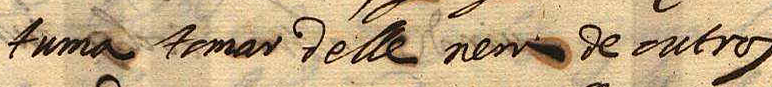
tuma tomar delle nem de outros
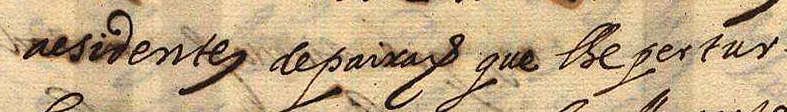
acsidentes de paixaõ que lhe pertur
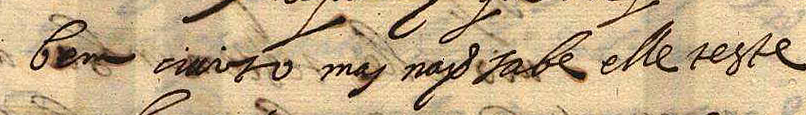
bem o iuizo mas naõ sabe elle teste
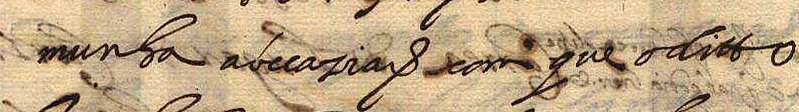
munha a occaziaõ com que o ditto
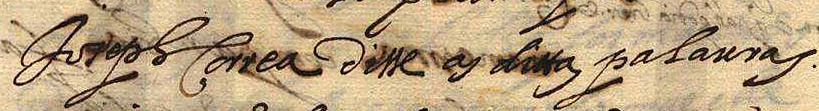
Joseph Correa disse as dittas palauras.
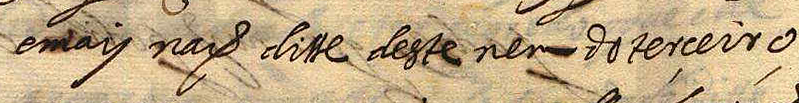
e mais naõ disse deste nem do terceiro
